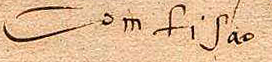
Comfisão
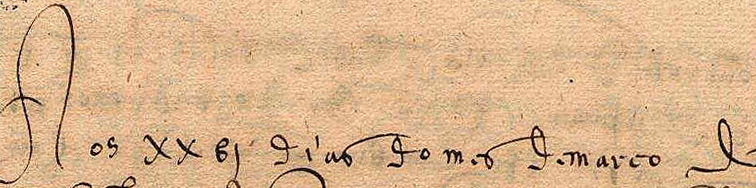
Aos xxbj dias do mes de março de
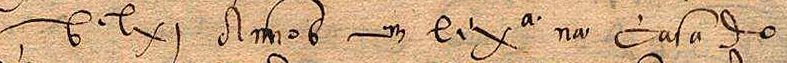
j̄ bc lxj Ann̄os em lixa na casa do
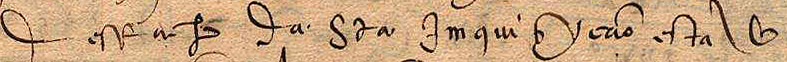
despacho da Sta Jmquisycaõ esta̅do
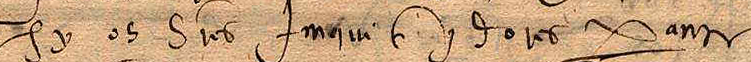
hy os Sr̅es Jmquisydores ꝑante
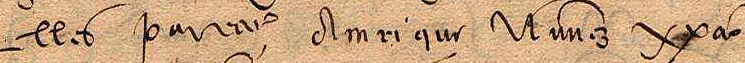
elles parecço Amrique Nun̄ez Xpaõ
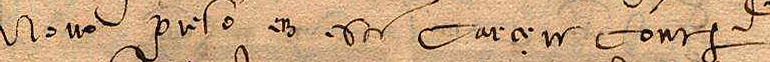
Nouo preso em este Carçere conthdo
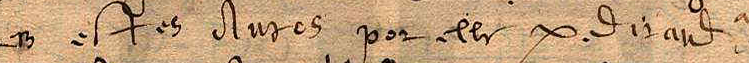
em estes Autos por elle pedir auda
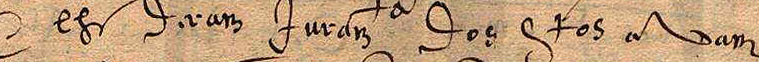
e lhe deram Juramto dos Stos avam
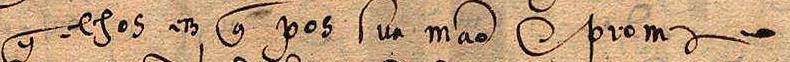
gelhos em q̅ pos sua mão e prometeo
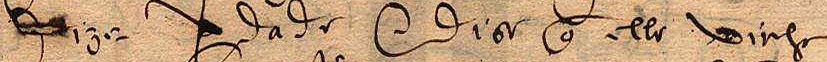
dizer ꝟdade e dise q̅ elle vinha
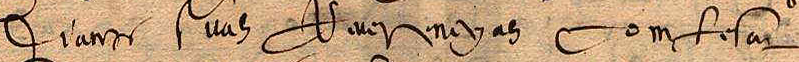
diante suas Reuerencyas Comfesar
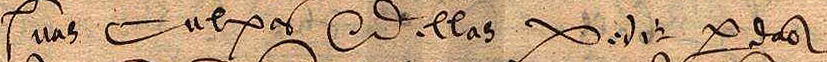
suas Culpas e dellas pedir ꝑdão
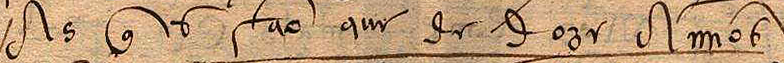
As q̅es são que de doze Anno̅s
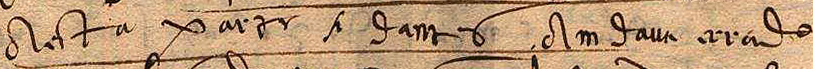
A esta parte e dantes Amdaua errado
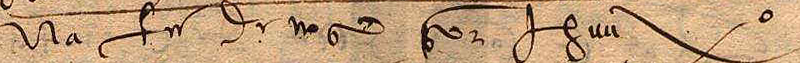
Na fee de noso s̅or Jhuu̅ Xo
